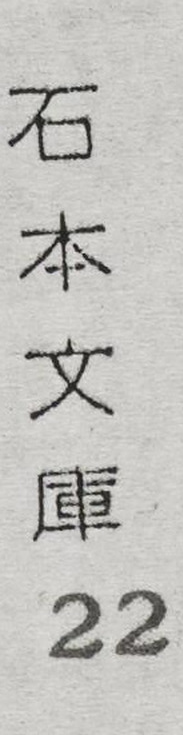石本文庫

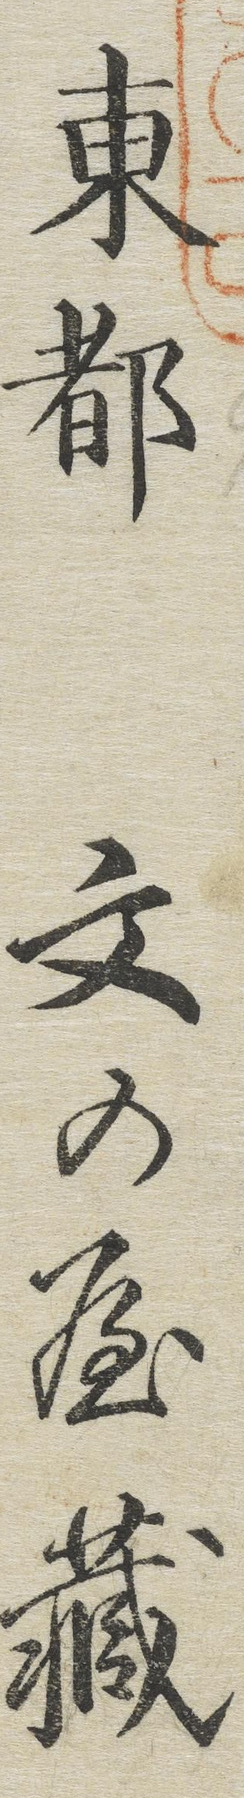東都文の屋蔵
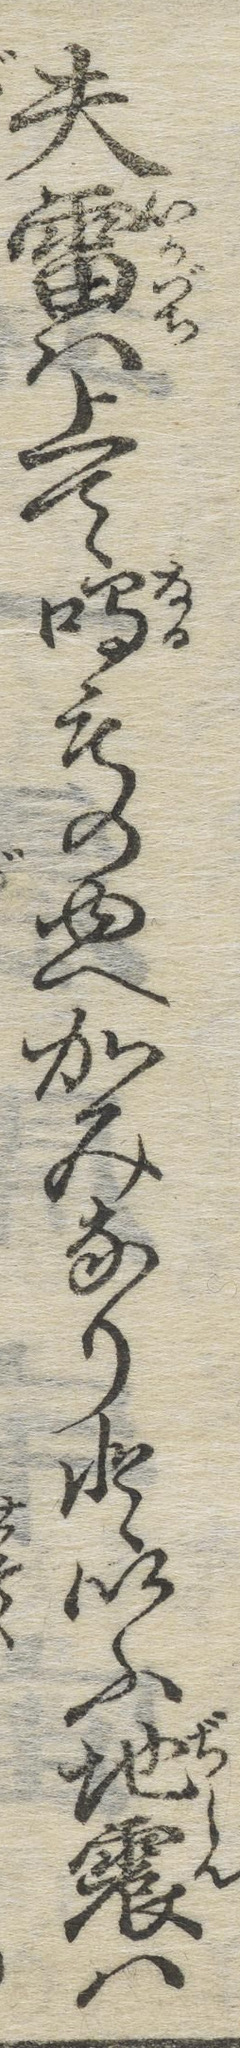夫雷は上て鳴ものゆへかみなりといふ地震は
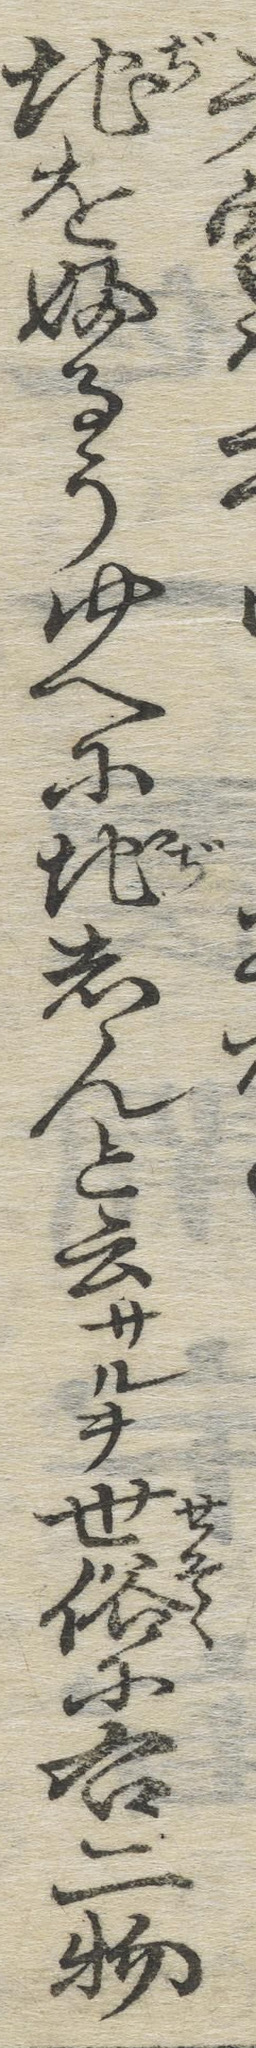地ふるうゆへに地しんと云サルヲ世俗に右二物
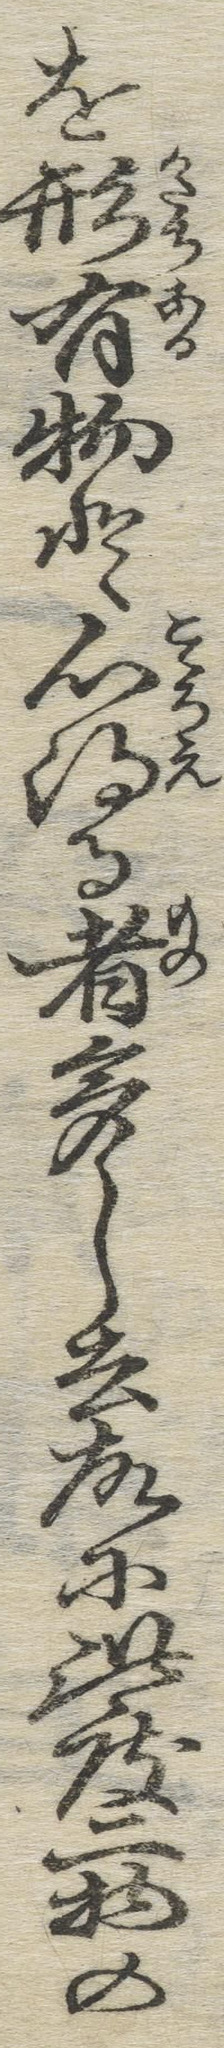を形有物と心得る者多し去故に此度二物の
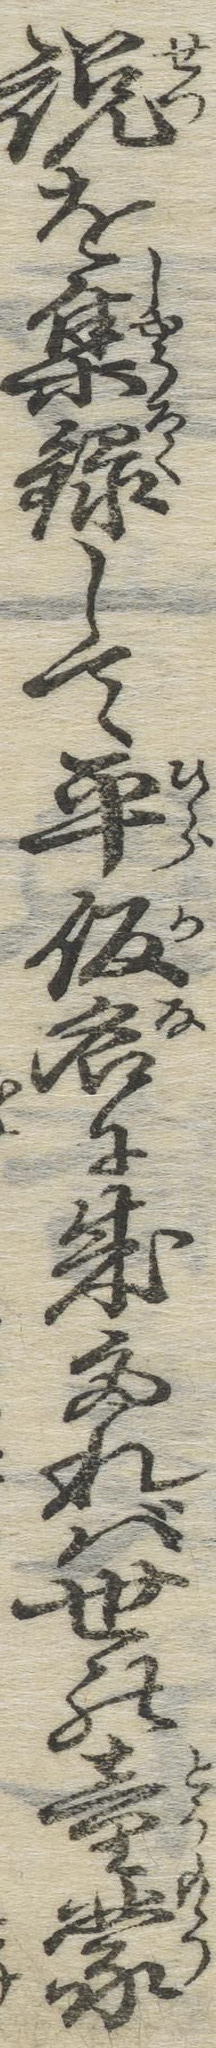説を集録して平仮名に成たれば世の童蒙
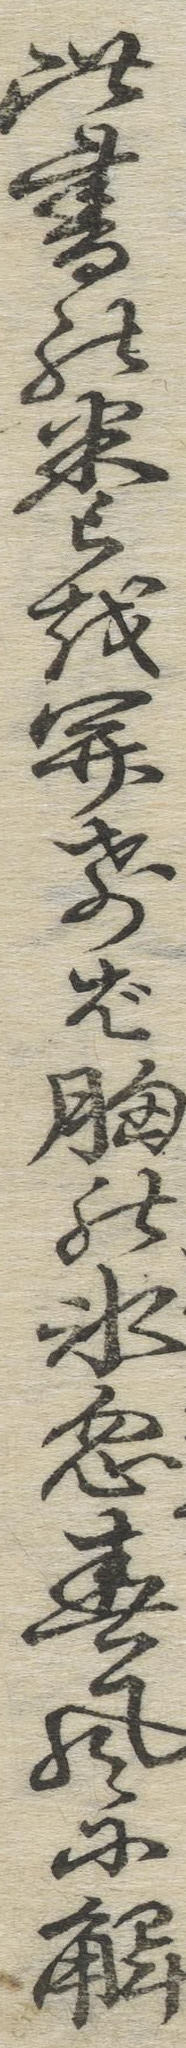此書の養を開せば胸の氷忽春風に解
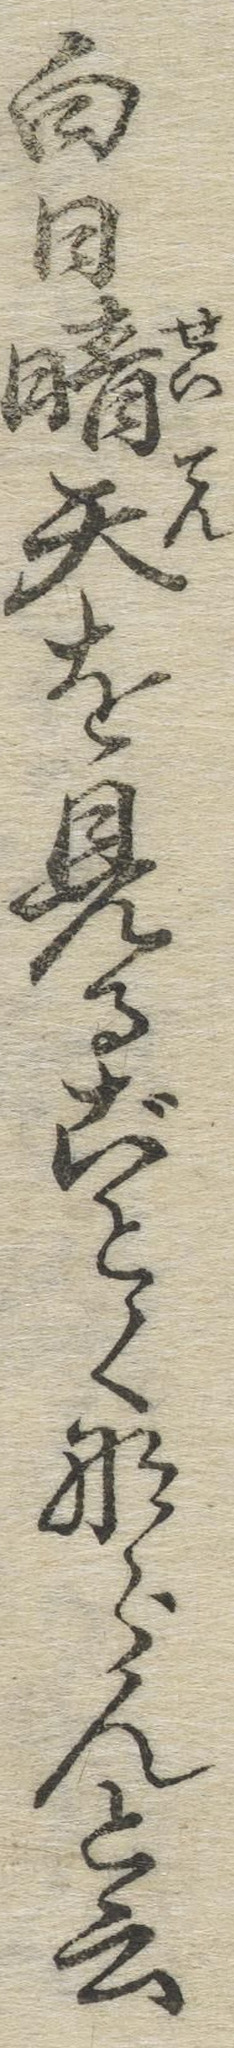白日晴天を見るごとくならんと云

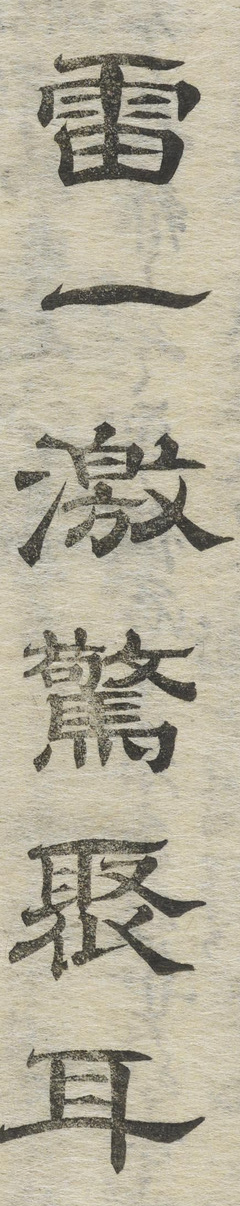雷一激驚聚耳
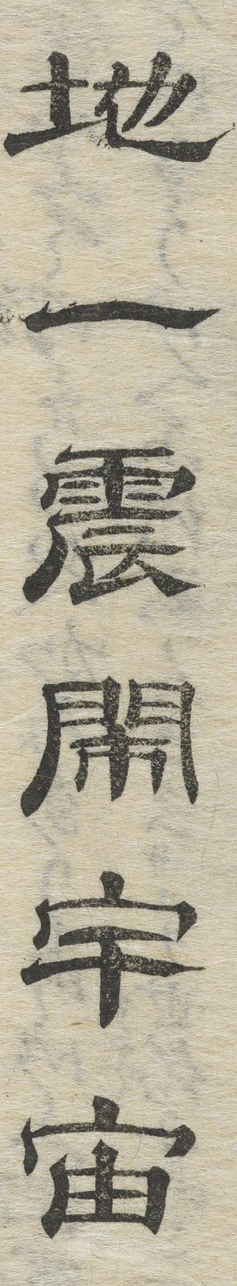地一震閙宇宙
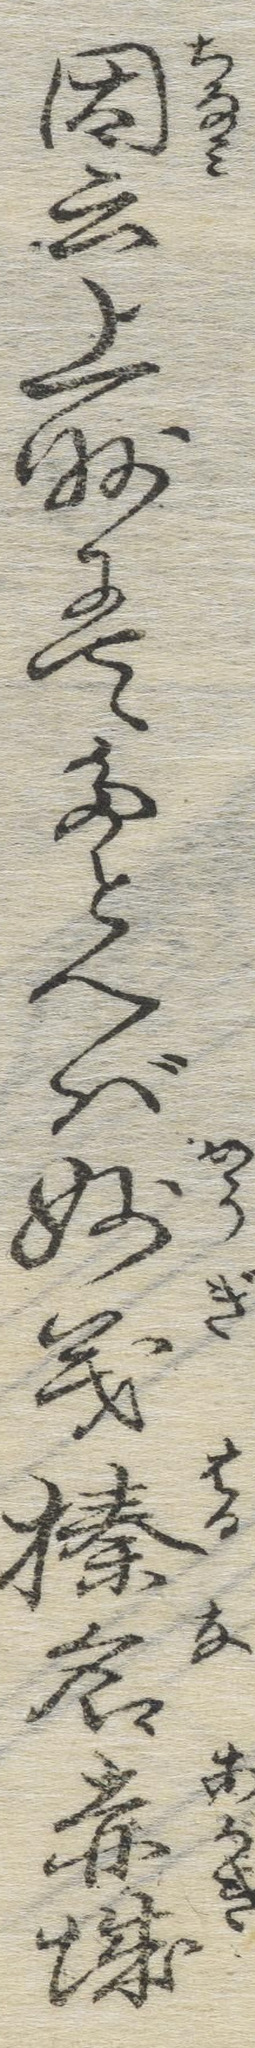因云上州にてたとへば妙義榛名赤城
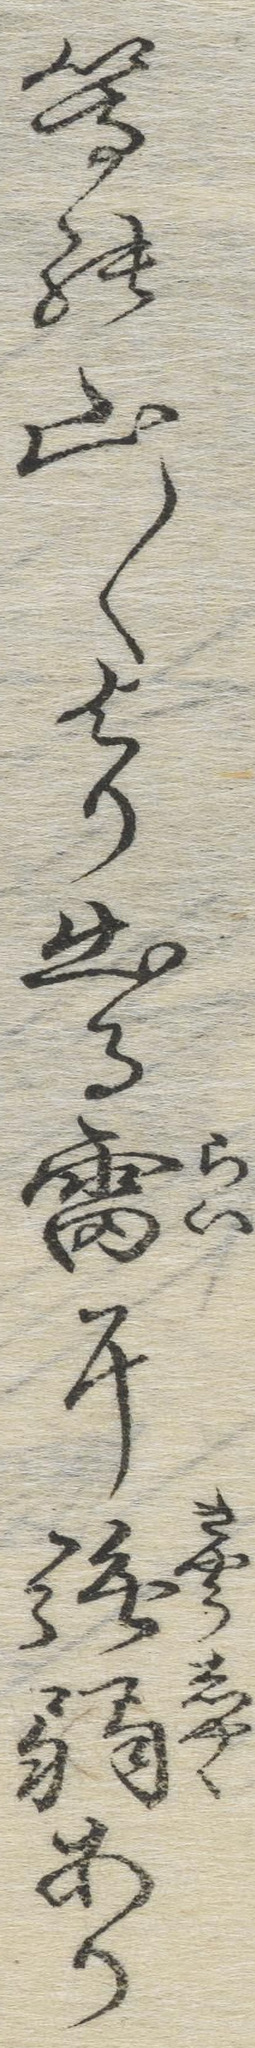等の山〱より出る雷に強弱あり
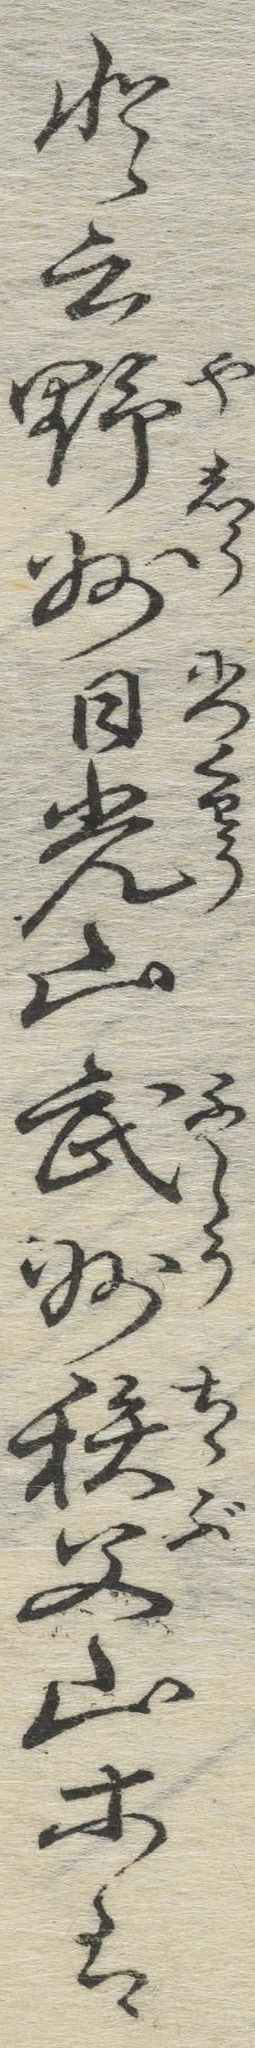と云野州日光山武州秩父山には
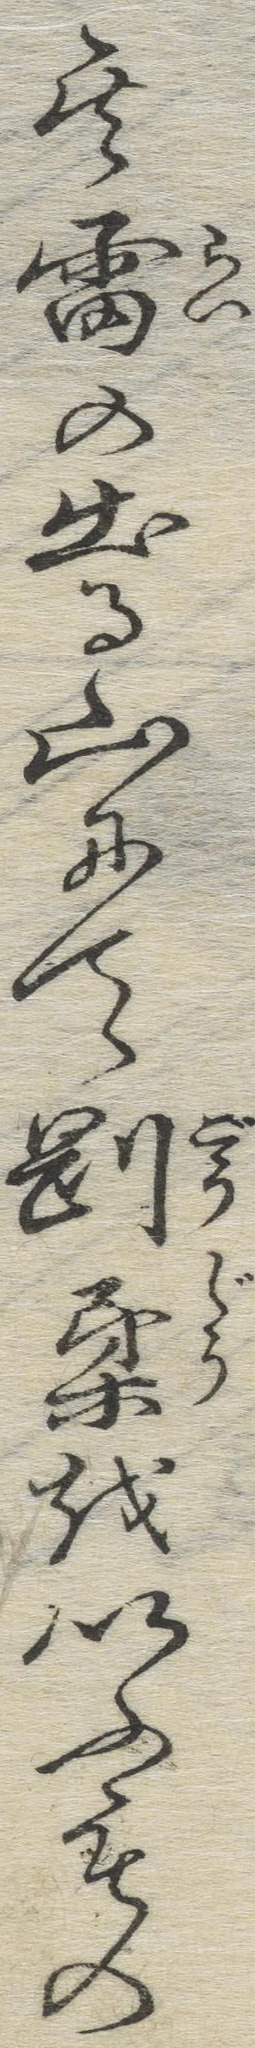其雷の出る山にて剛柔をいふもの
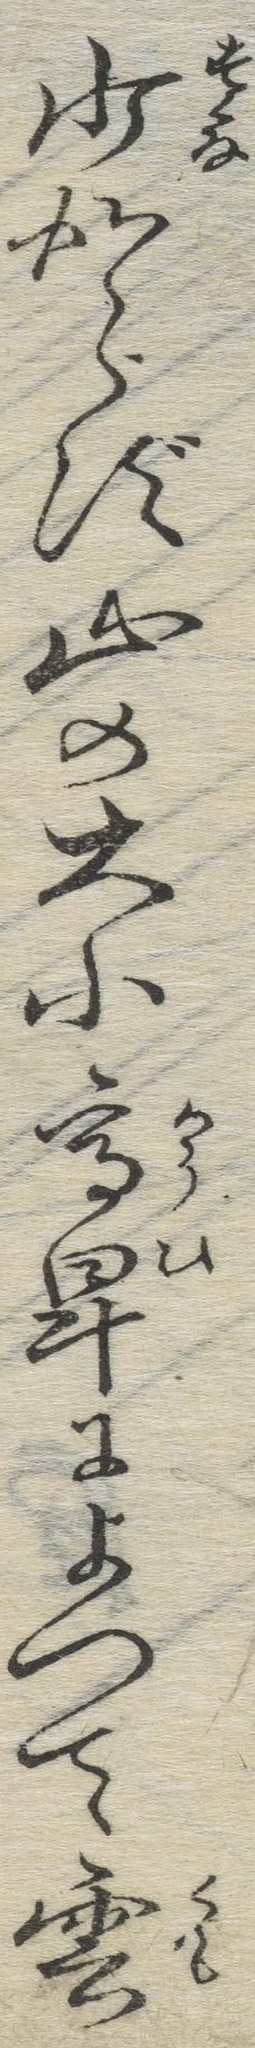少からず山の大小高卑によって雲
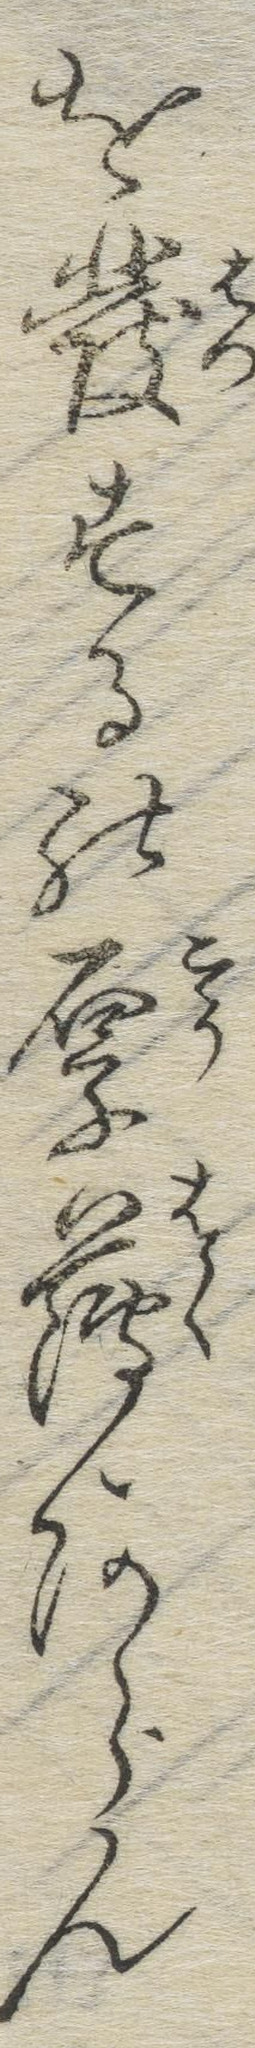を發するの厚薄あらん
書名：雷公地震由來記　全
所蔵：東京大学地震研究所図書室 Earthquake Research Institute Library, The University of Tokyo, JAPAN
